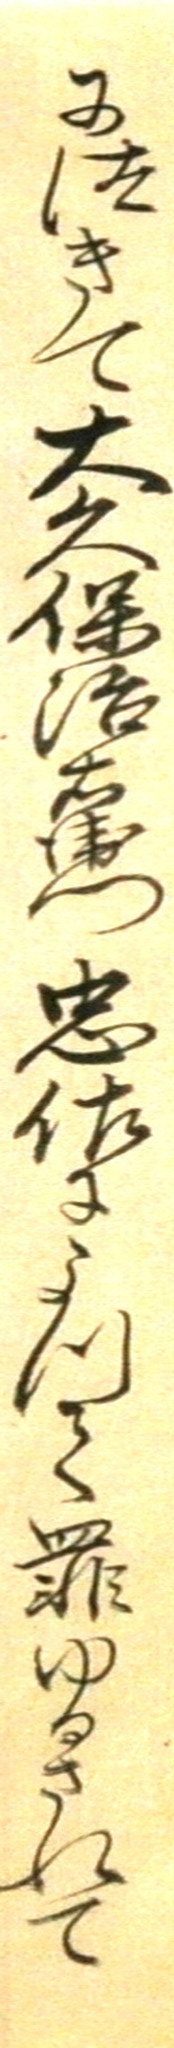につきて大久保治右衛門忠佐によつて罪ゆるされて
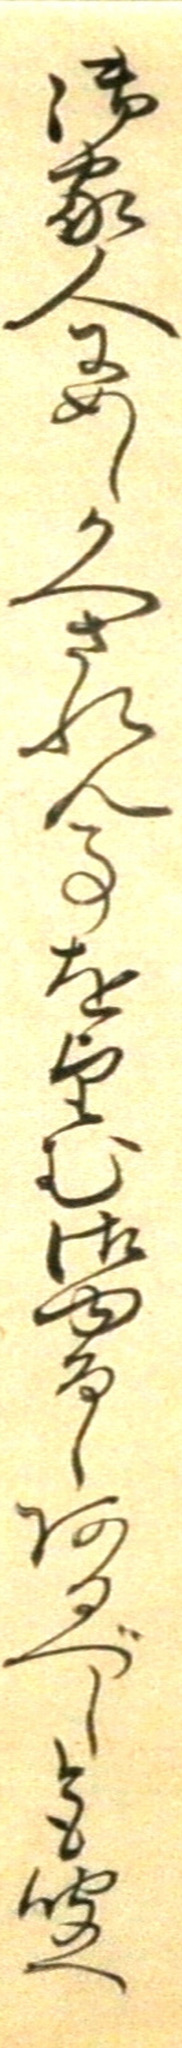御家人にめしかへされん事を望む御ゆるしあるべしとも聞へ
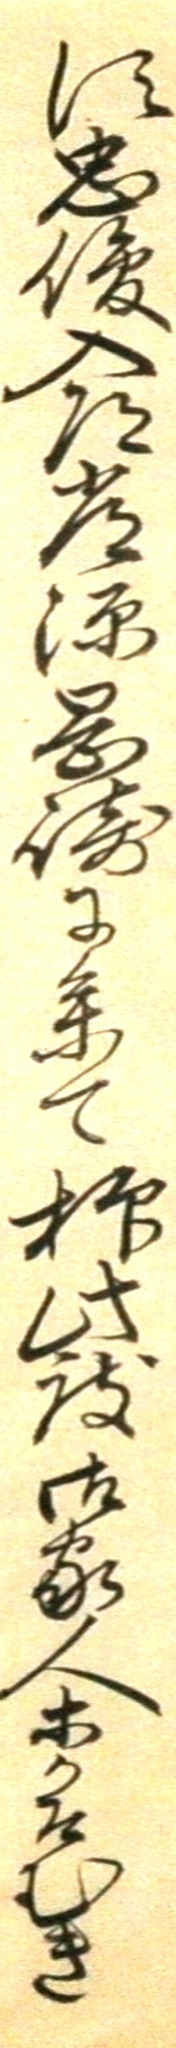す忠俊入道常源岡崎に参て抑此度御家人等かそむき
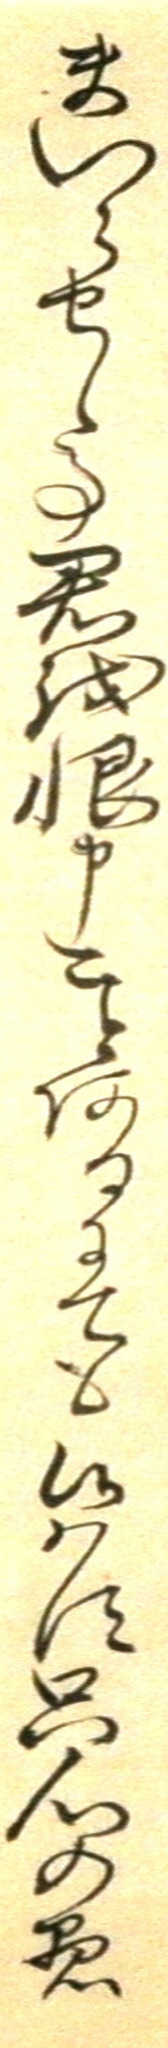まいらせし事君を恨申ことあるにても候わす只心の愚
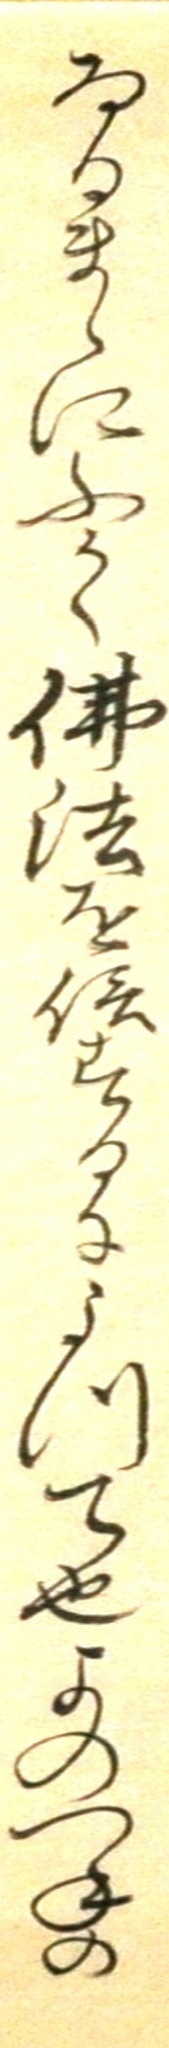なるまゝにふかく仏法を信するによつて也よのつねの
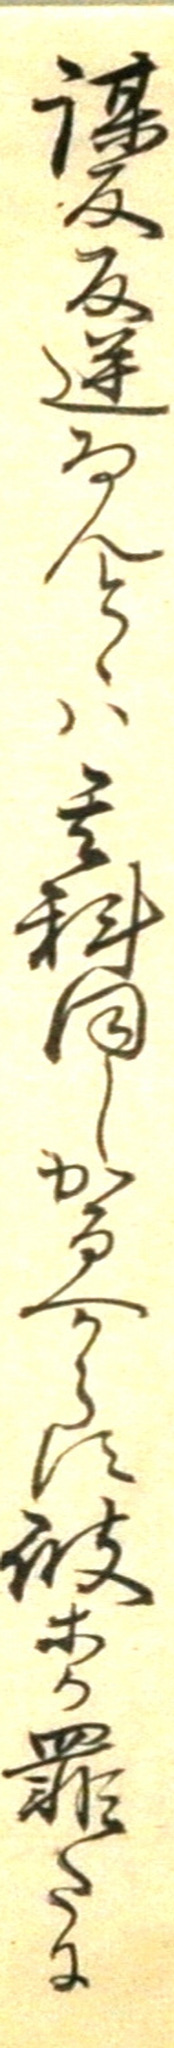謀反反逆なんとゝは其科同しかるへからす彼等か罪たに
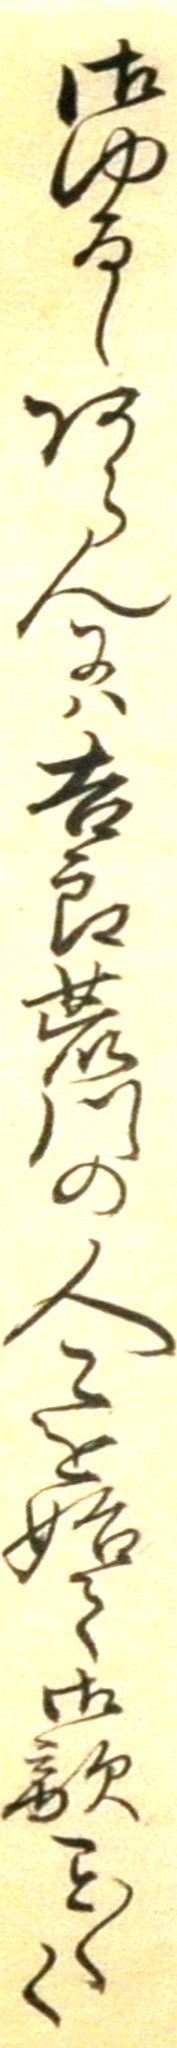御ゆるしあらんには吉良荒川の人々を始て御敵こと〳〵く
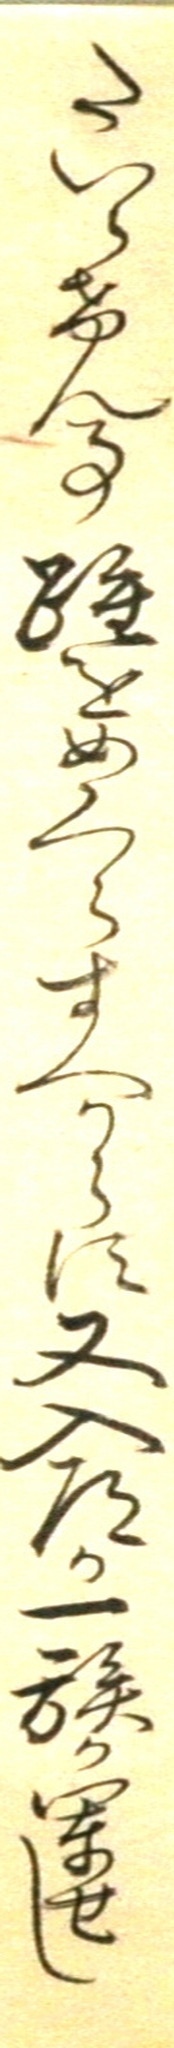たいらけん事踵をめくらすへからす又入道か一族か軍せし
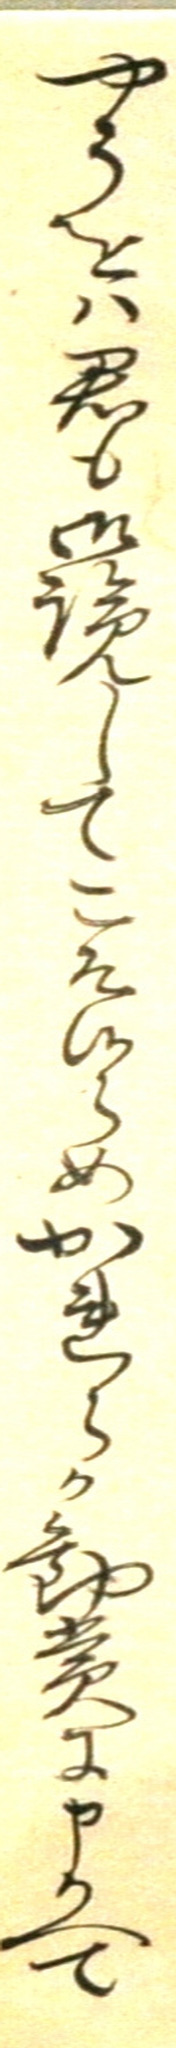やうをは君も御覧してこそ候らめかれらか勧賞に申かへて
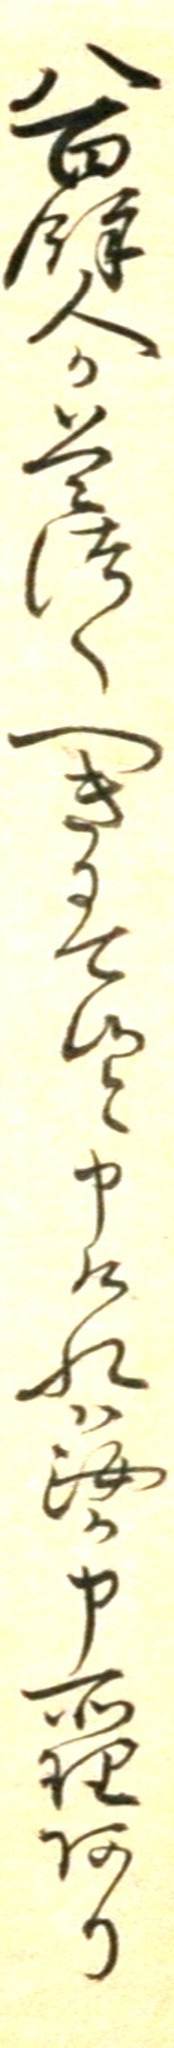八百余人か首つくへきにて候と申けれは汝か申所理あり
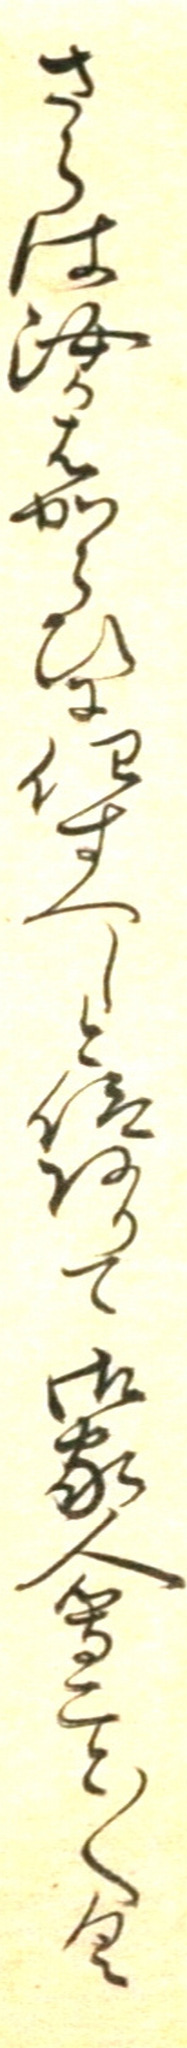さらは汝かはからひに任すへしと仰ありて御家人等こと〳〵く
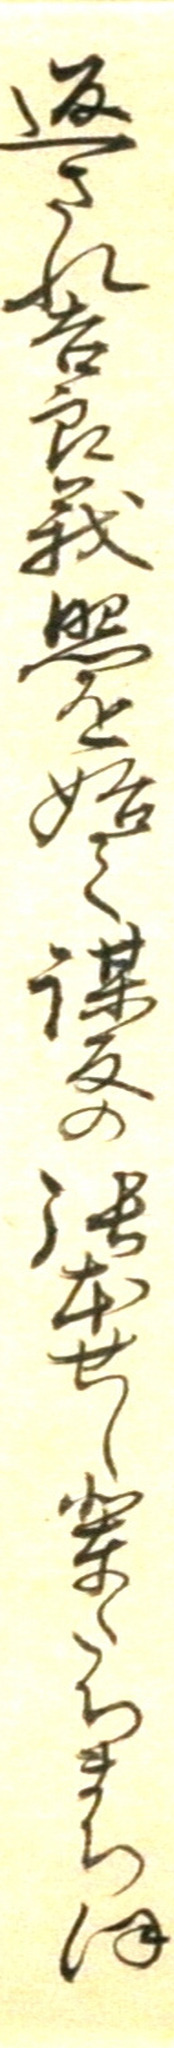返され吉良義照を始て謀反の張本せし輩たちまちほ
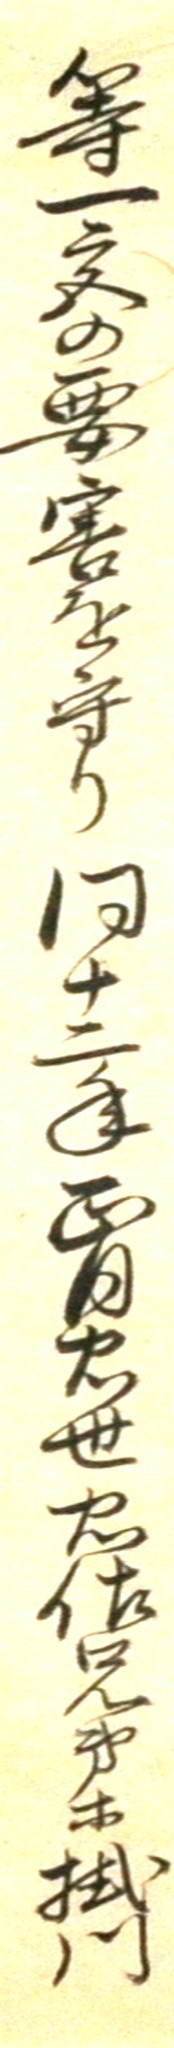等一宮の要害を守り同十二年正月忠世忠佐兄弟等掛川
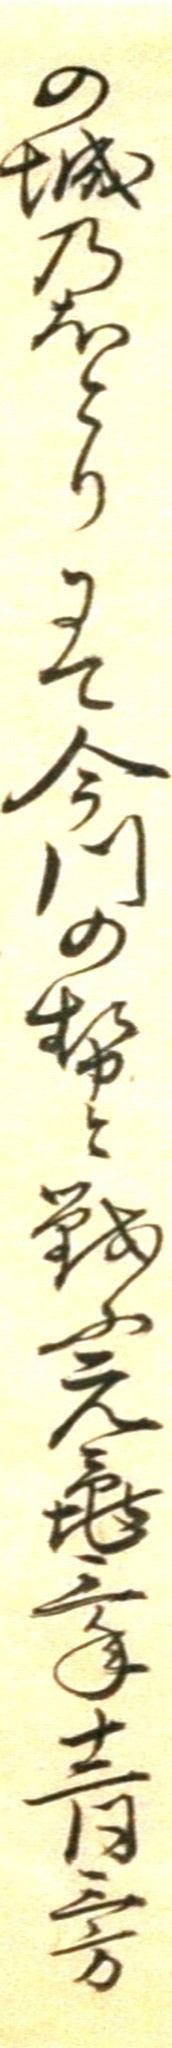の城のほとりにて今川の勢と戦ふ元亀三年十二月三方
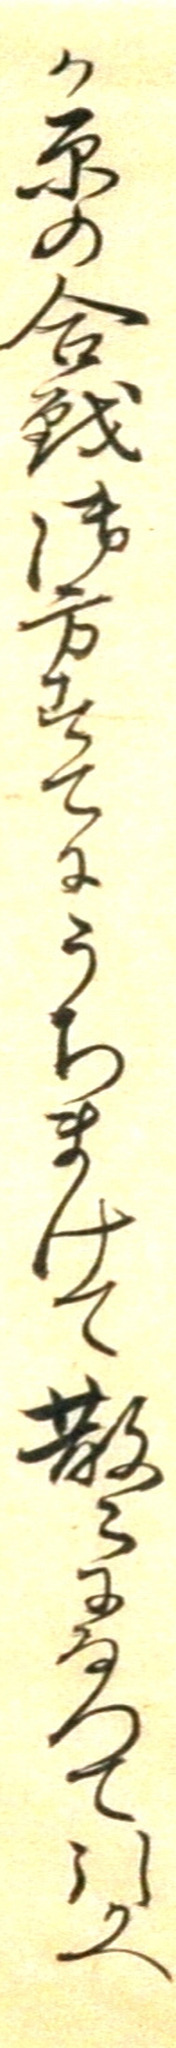か原の合戦御方すてにうちまけて散々になつて引かへ
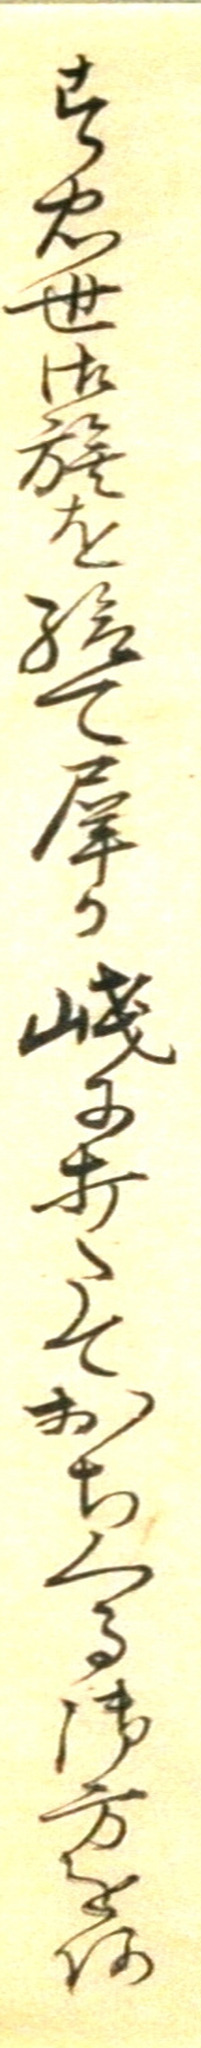す忠世御旗を給て犀か㟞に打たておちくる御方をあ
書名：藩翰譜（四・中）
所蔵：伊那市立高遠町図書館・合同会社AMANE
